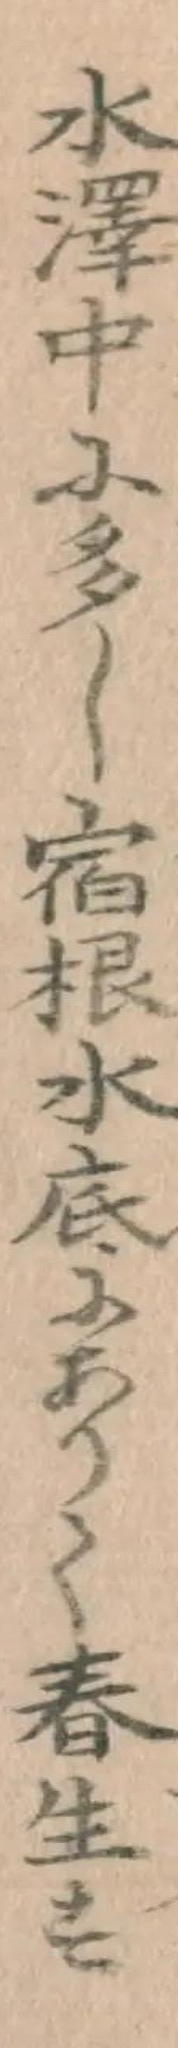水沢中に多し宿根水底にありて春生す
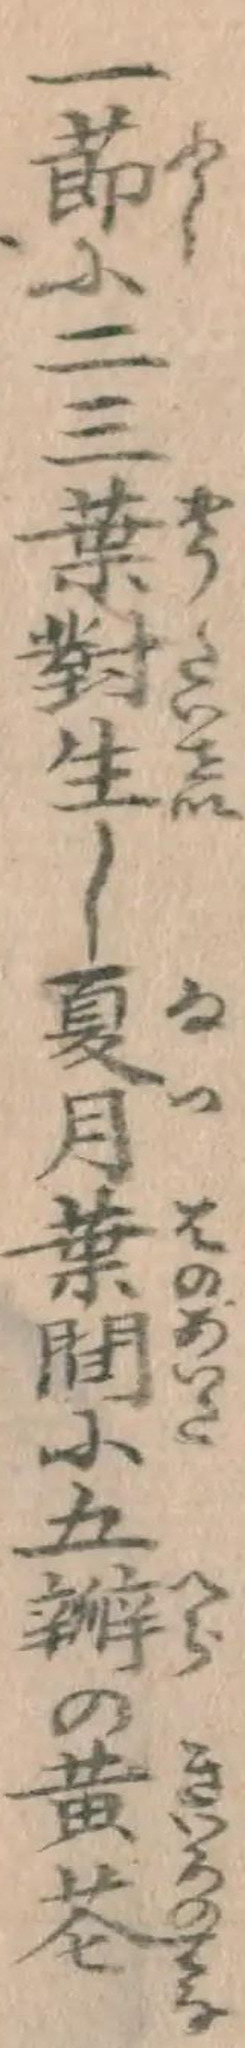一節に二三葉対生し夏月葉間に五弁の黄花
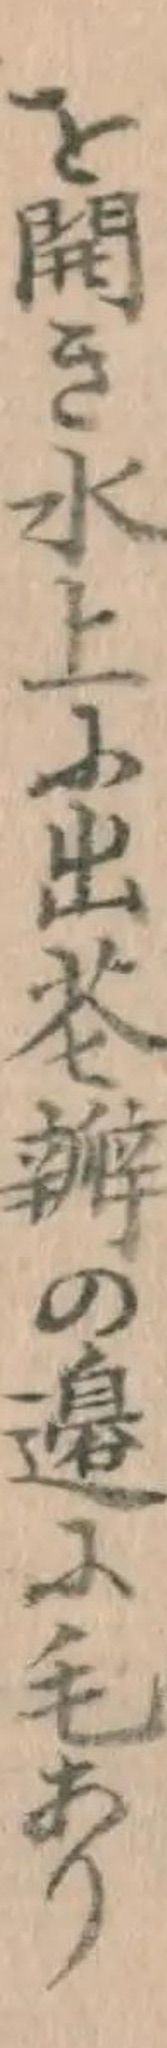を開き水上に出花弁の辺に毛あり
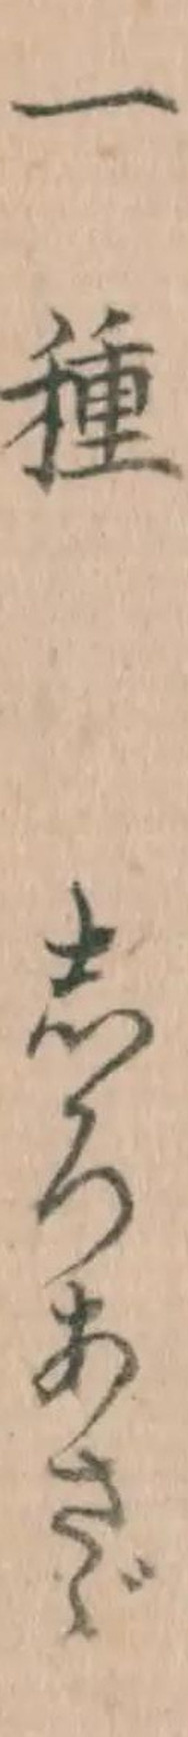一種しろあさゞ
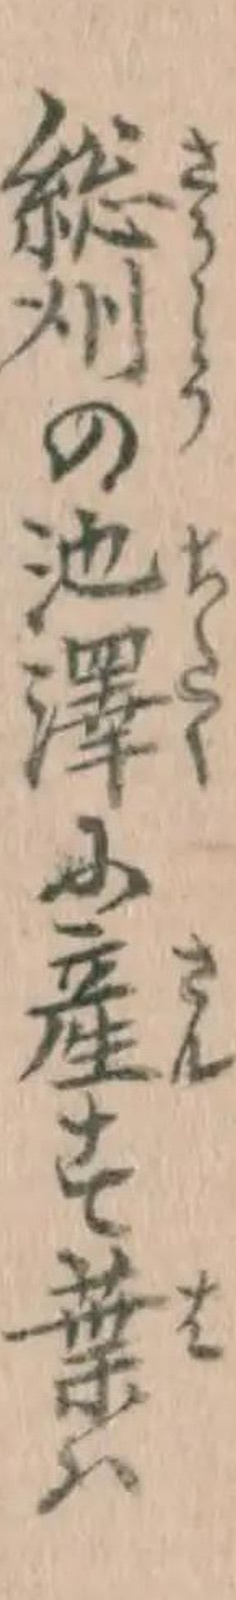総州の池沢に産す葉は
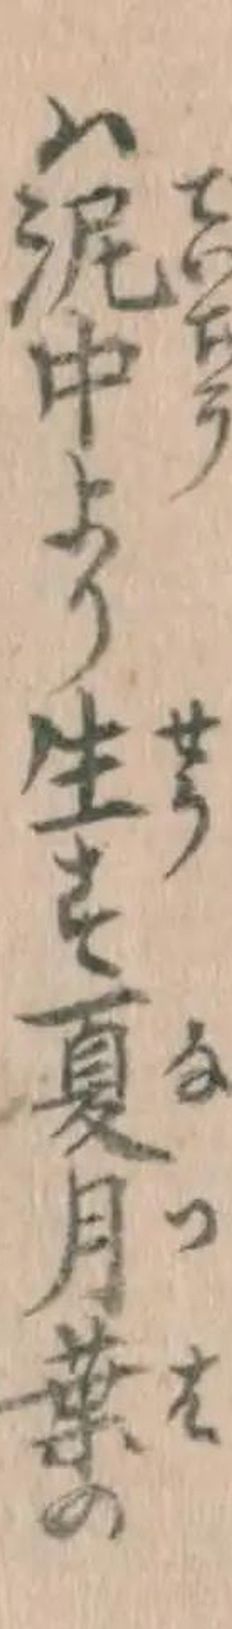は泥中より生す夏月葉の
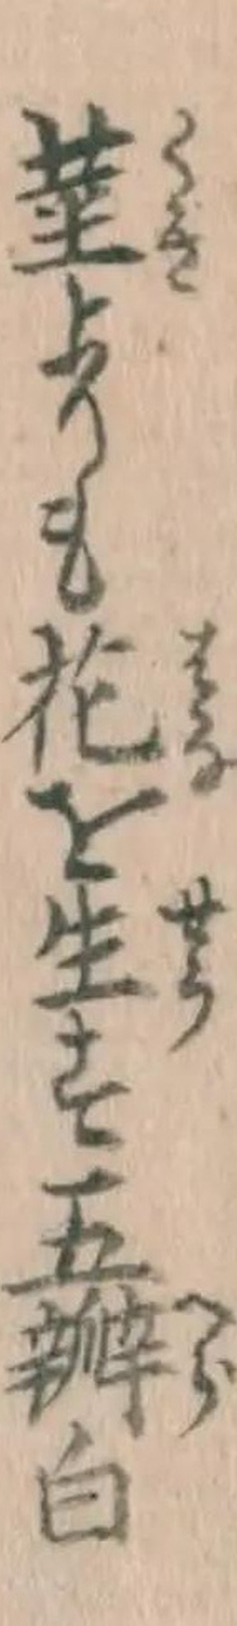茎よりも花を生す五弁白
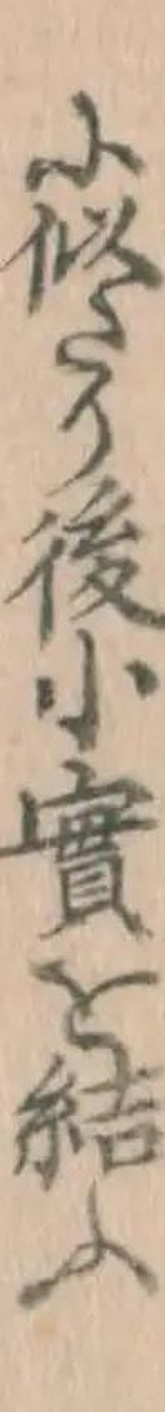に似たり後小実を結ふ

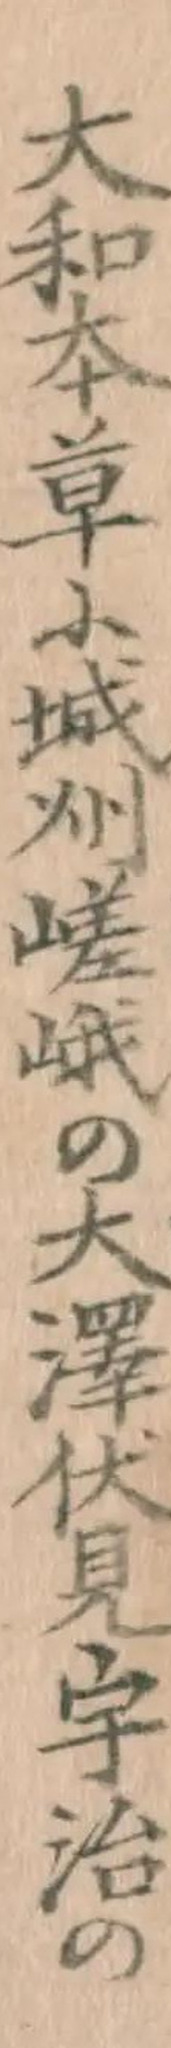大和本草に城州嵯峨の大沢伏見宇治の
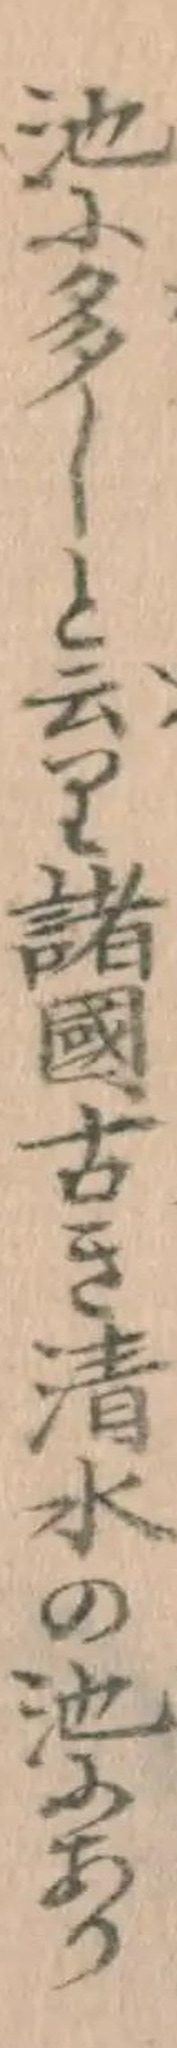池に多しと云り諸国古き清水の池にあり
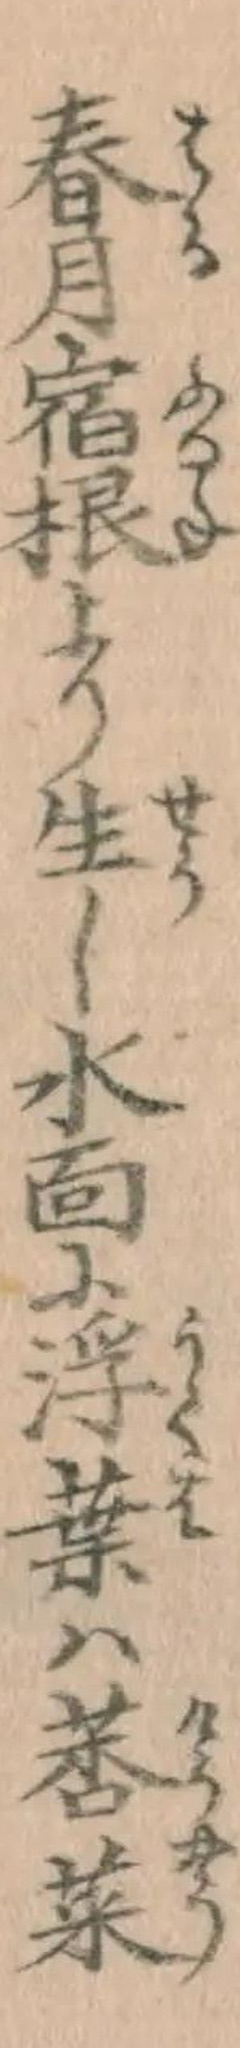春月宿根より生し水面に浮葉は莕菜
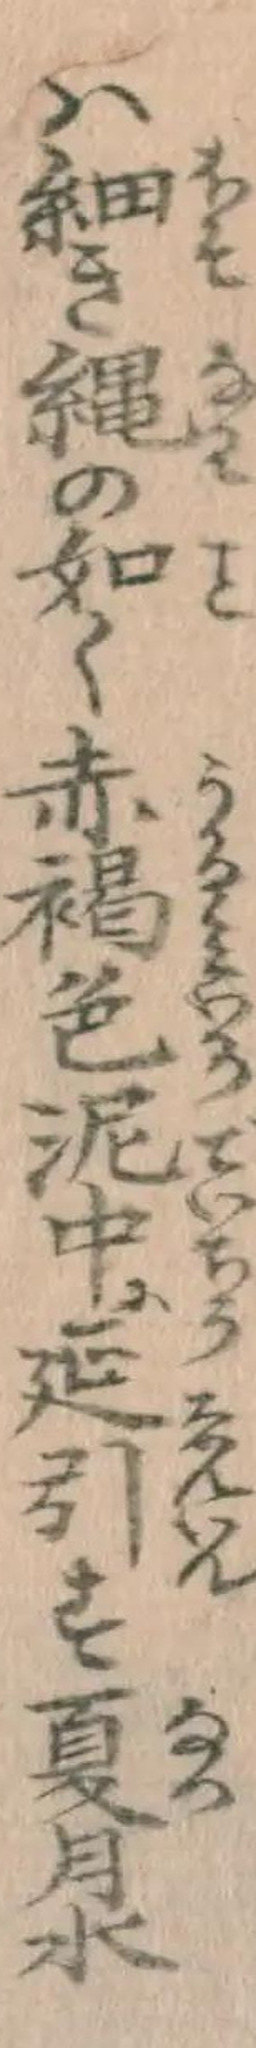は細き縄の如く赤褐色泥中延引す夏月水
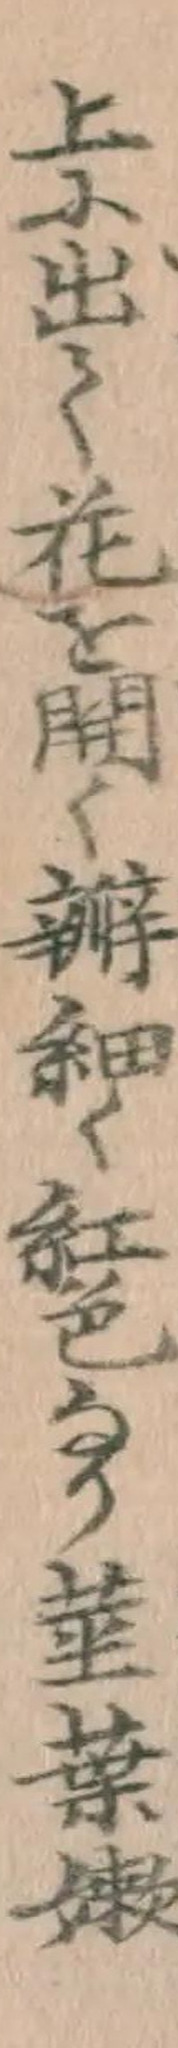上に出て花を開く弁細く紅色なり茎葉嫩
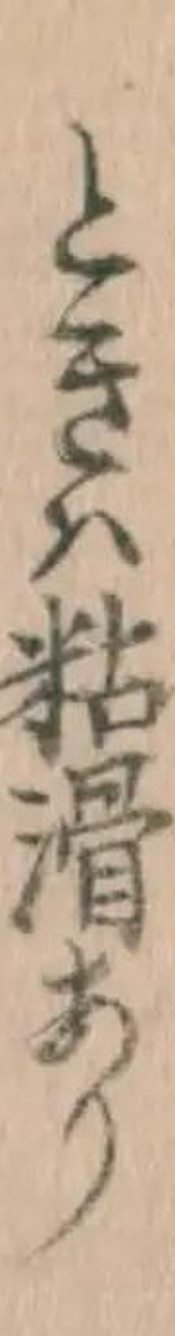ときは粘滑あり
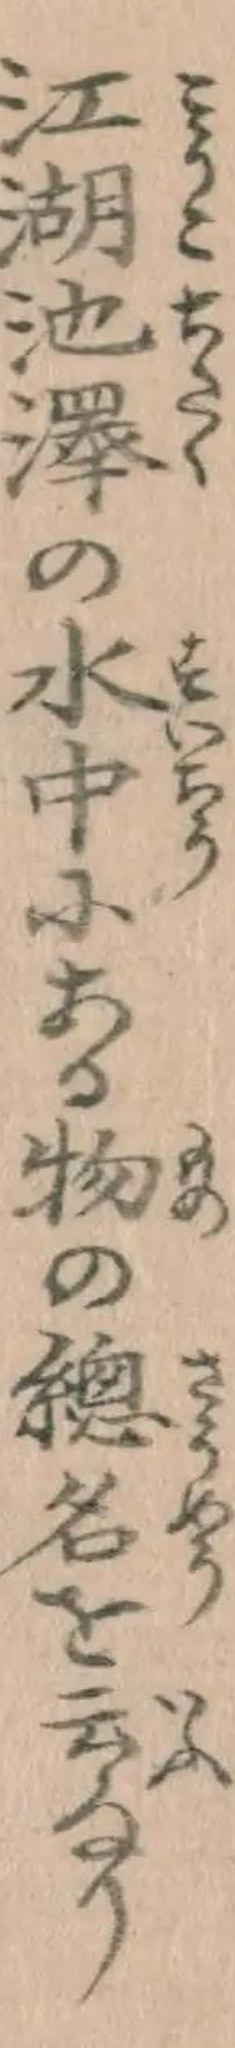江湖池沢の水中にある物の総名を云なり
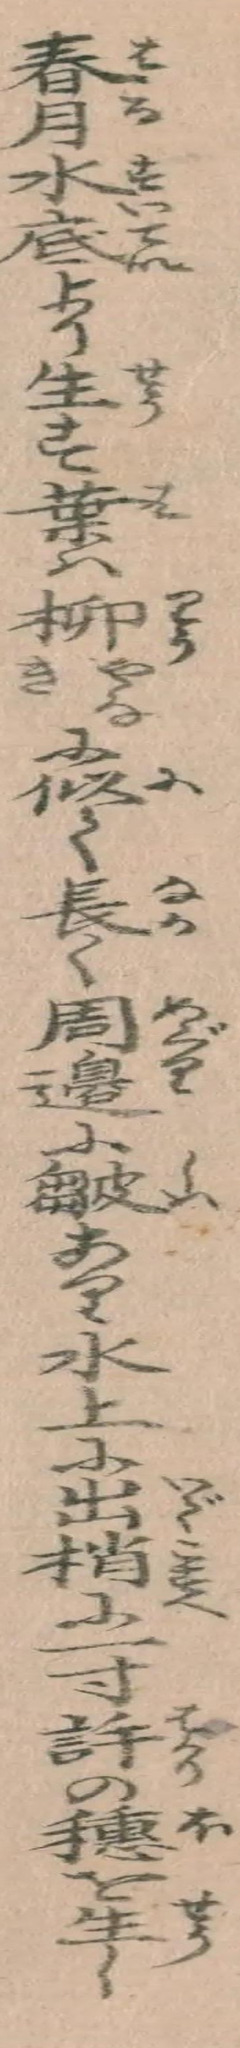春月水底より生す葉は柳やなきに似て長く周辺に皺あり水上に出梢に一寸許の穂を生し
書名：本草図譜. 巻34-36
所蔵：国立国会図書館 National Diet Library, JAPAN
